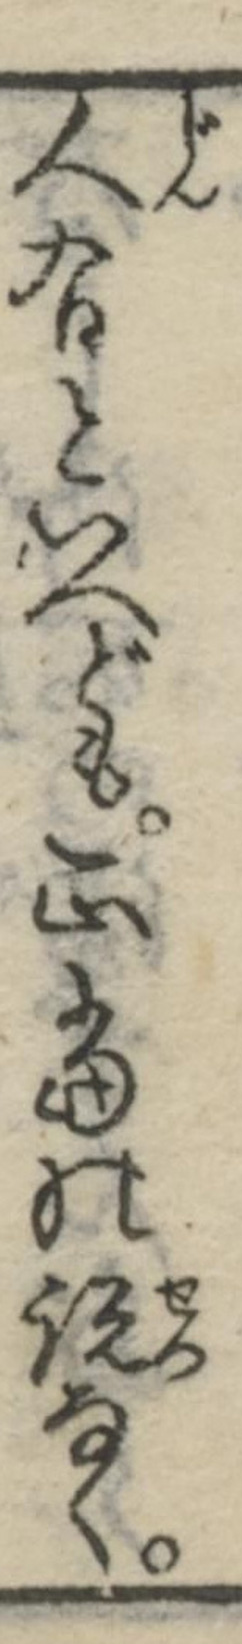人有といへども。正当の説なく。
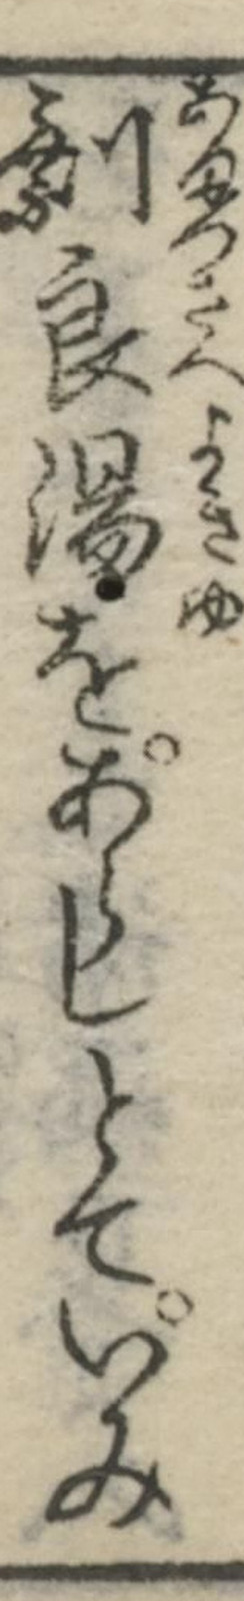剰良湯を。あらしとて。いみ
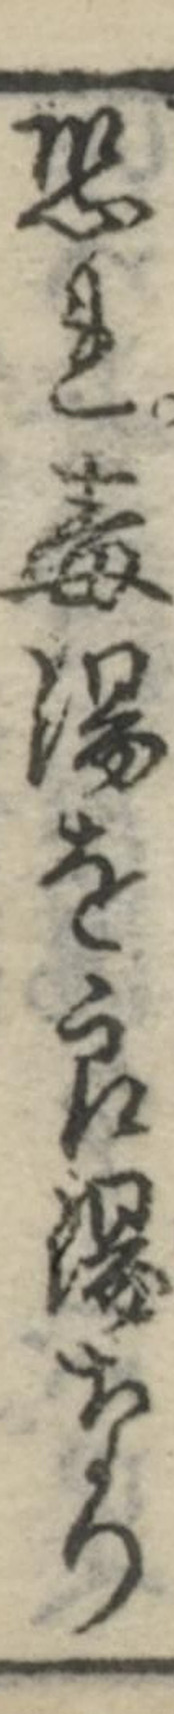恐れ。毒湯を良湯なり
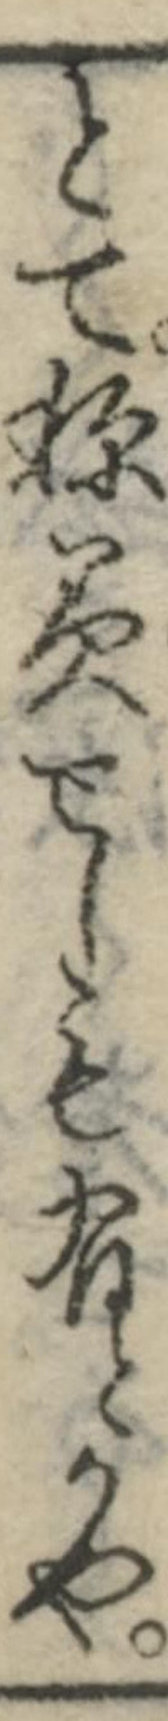とて。様美せしも有とかや。
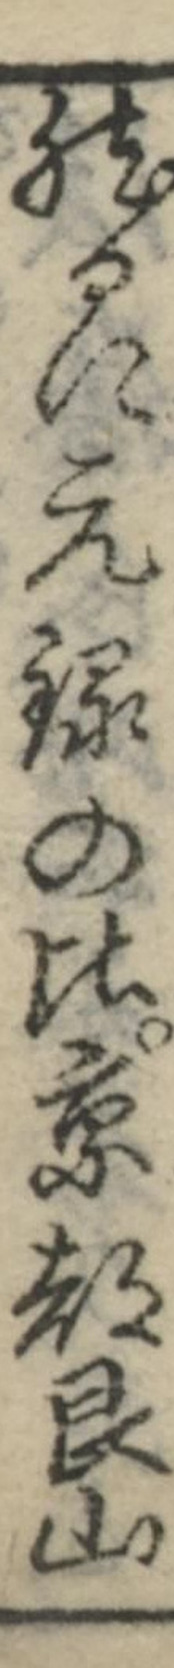然るに元禄の比。京都艮山

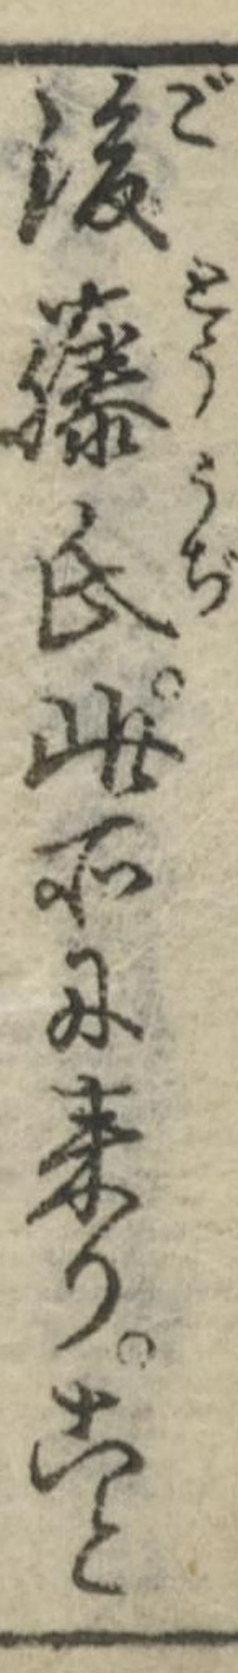後藤氏。此所に来り。こと
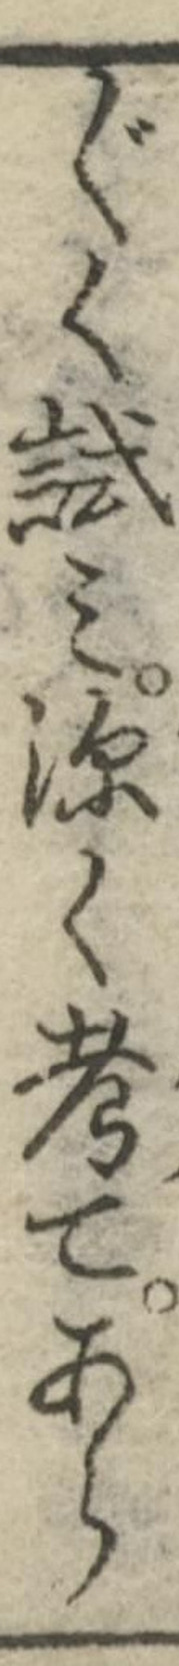〴〵く試み。深く考て。あら
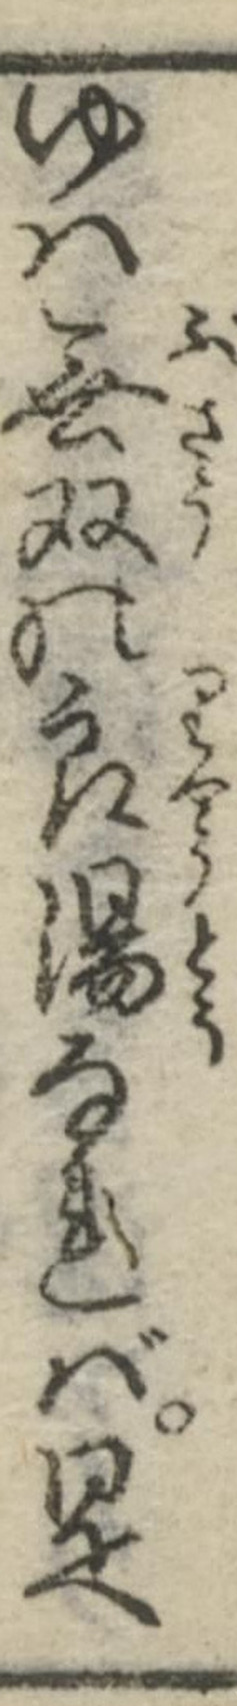ゆは無双の良湯なれば。是
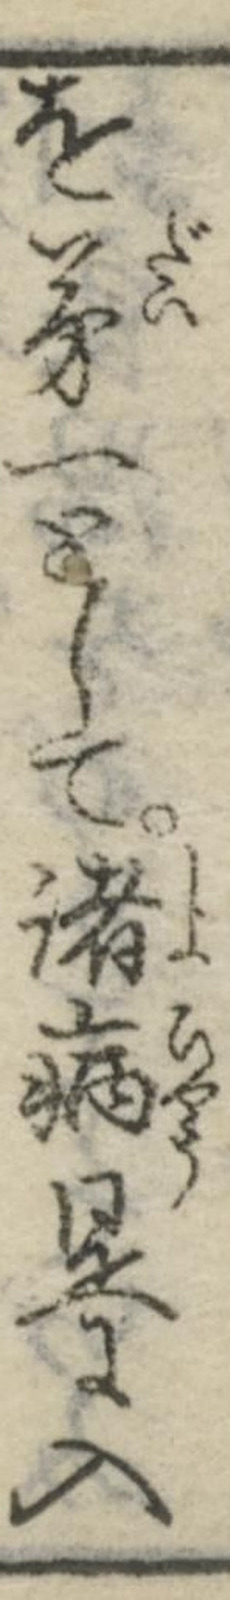を第一として。諸病是に入
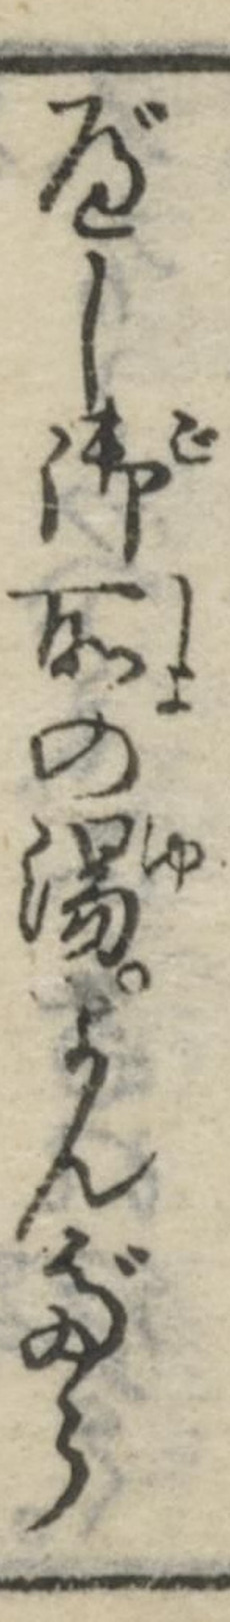べし御所の湯。まんだら
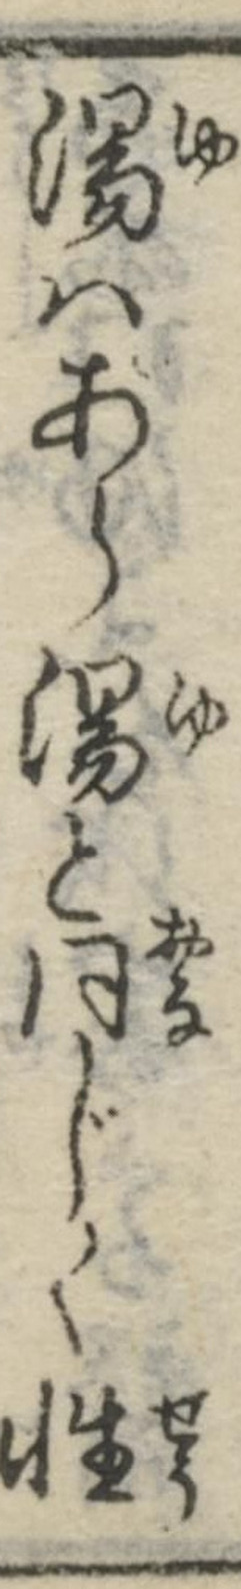湯はあら湯と同じく性
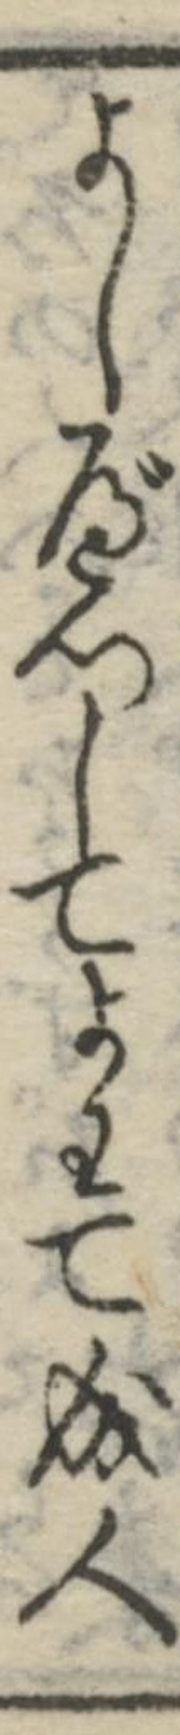よしべつしてよりて成人。
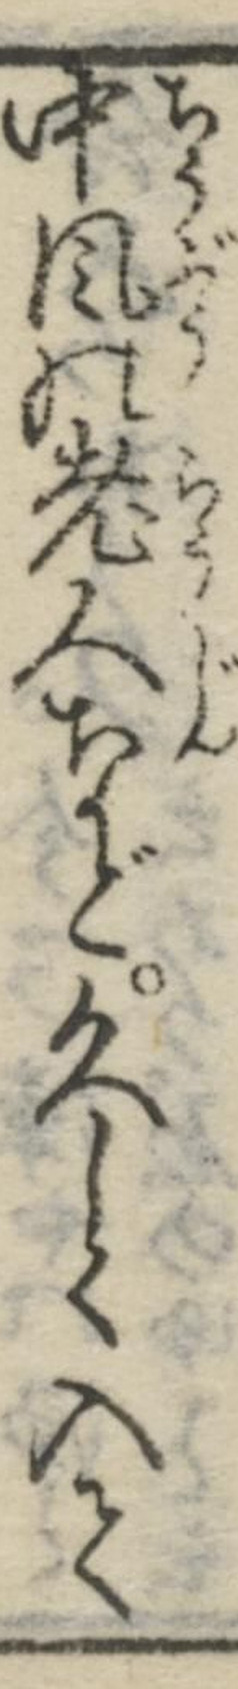中風の老人など。久しく入て
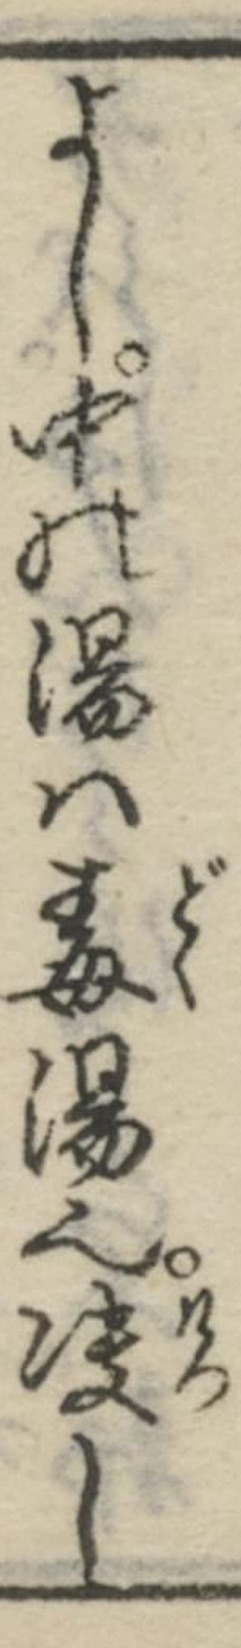よし。中の湯は毒湯也。決し
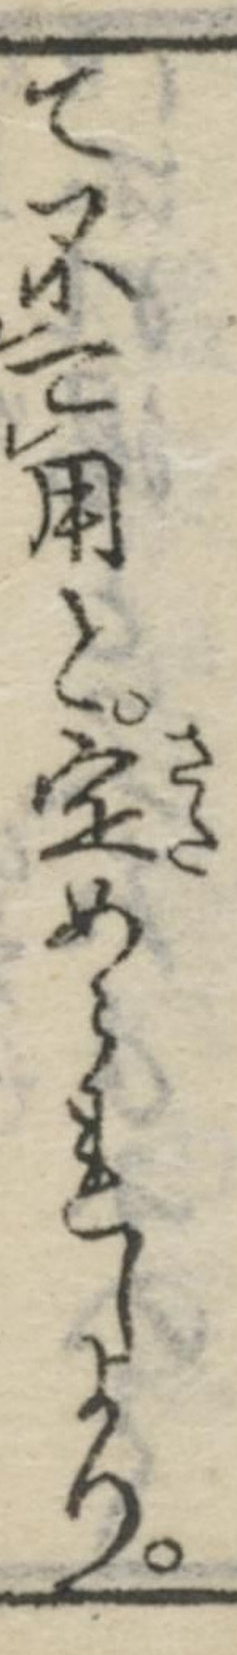て不可用と。定められしより。
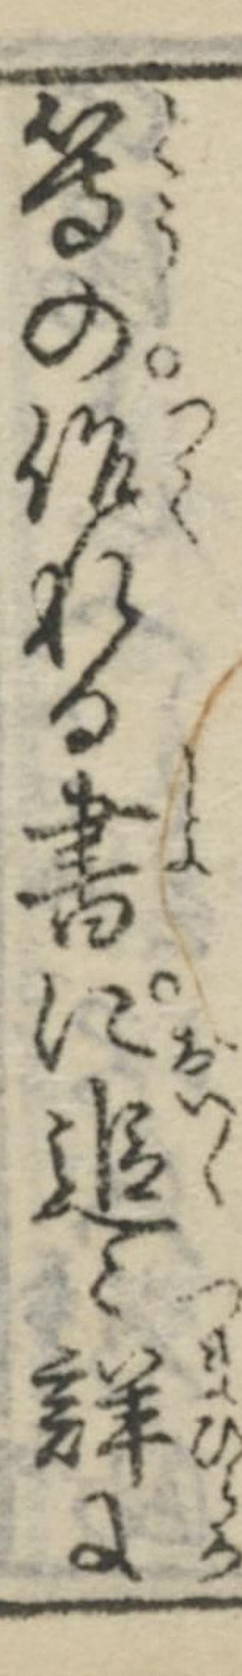等の。作れる書。に追々詳に
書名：但州城崎浴湯辧
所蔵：東京大学地震研究所図書室 Earthquake Research Institute Library, The University of Tokyo, JAPAN
